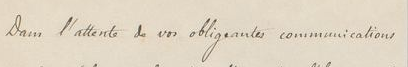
Dans l'attente de vos obligeantes communications
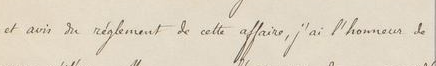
et avis du règlement de cette affaire, j'ai l'honneur de
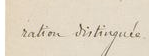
ration distinguée.
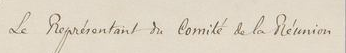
Le Représentant du Comité de la Réunion
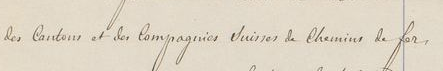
des Cantons et des Compagnies Suisses de Chemins de fer,
